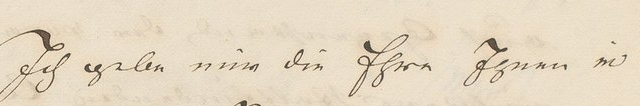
Ich gebe mir die Ehre Ihnen in
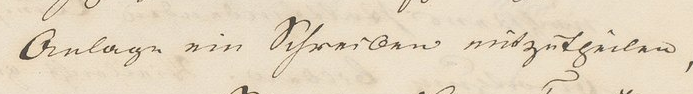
Anlage ein Schreiben mitzutheilen,
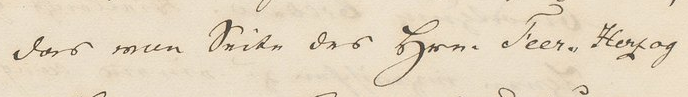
das von Seite des Hrn. Feer-Herzog
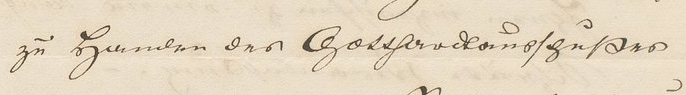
zu Handen des Gotthardtausschußes
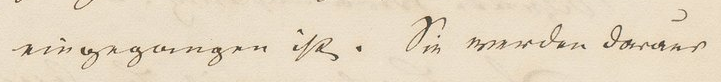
eingegangen ist. Sie werden daraus
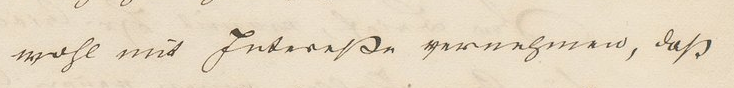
wohl mit Intereße vernehmen, daß
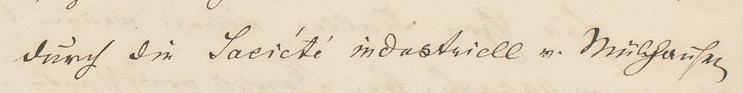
durch die Société industriell v. Mülhausen
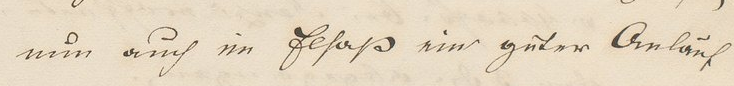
nun auch im Elsaß ein guter Anlauf
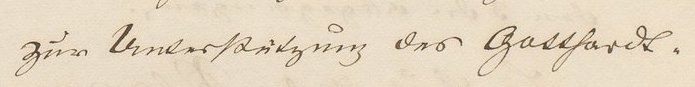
zur Unterstützung des Gotthardt -
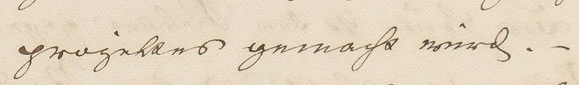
projektes gemacht wird. –
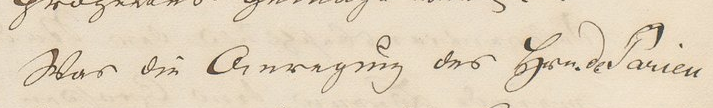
Was die Anregung des Hrn. de Parieu
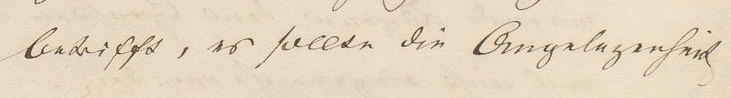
betrifft, es sollte die Angelegenheit
